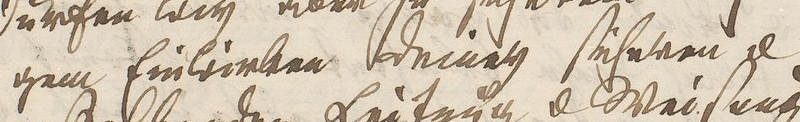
gem Einwirken Deiner sicheren &
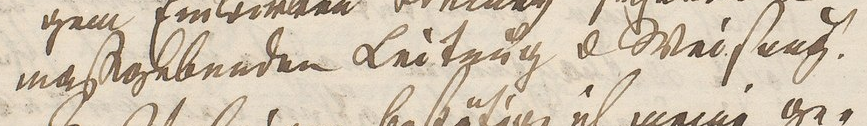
maßgebenden Leitung & Weisung.
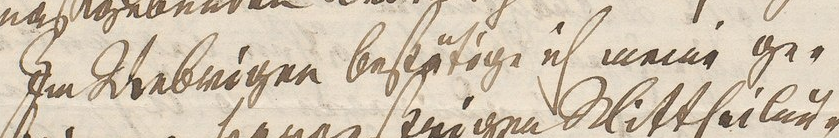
Im Uebrigen bestätige ich meine ge-
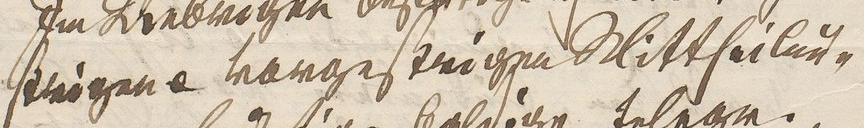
strigen & vorgestrigen Mittheilun-
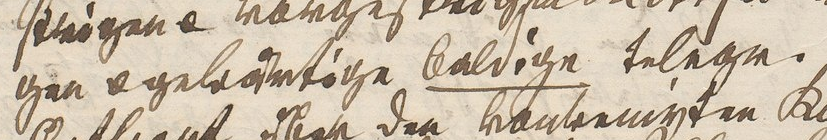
gen & gewärtige baldige telegr.
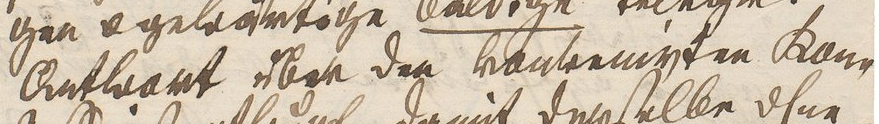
Antwort über den konvenirten Kon-
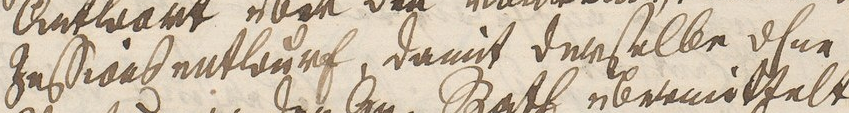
zessionsentwurf, damit derselbe ohne
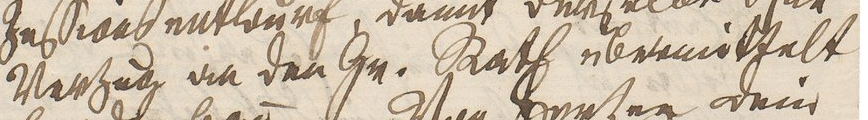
Verzug an den Gr. Rath übermittelt
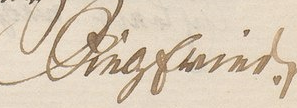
Siegfried.
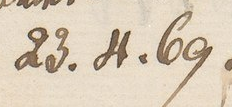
23. 4. 69.
